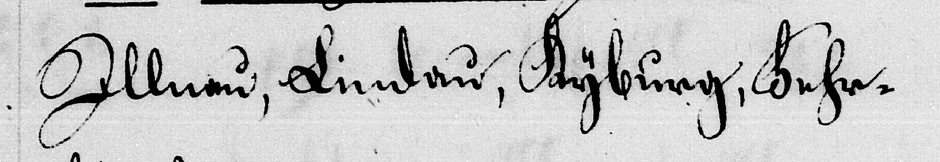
Illnau, Lindau, Kyburg, Fehr¬
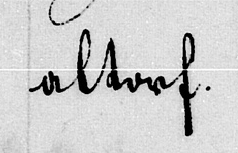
altorf.
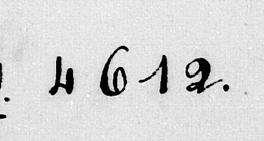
4612.
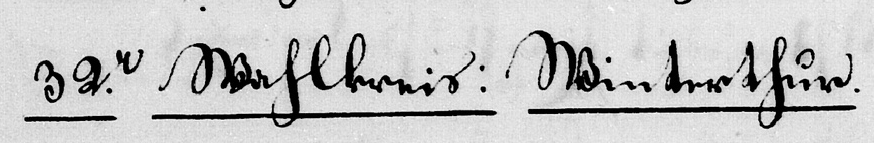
32.r Wahlkreis: Winterthur.
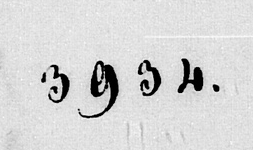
3934.
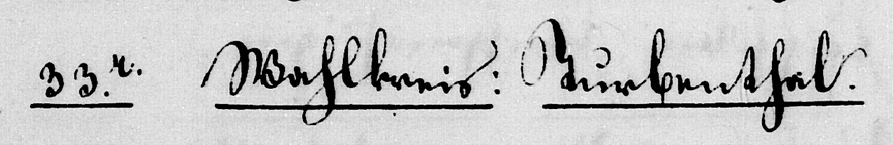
33.r. Wahlkreis: Turbenthal.
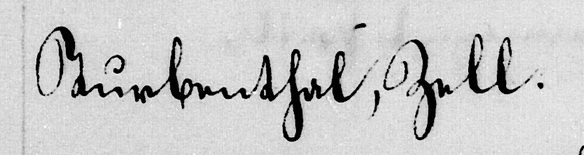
Turbenthal, Zell.
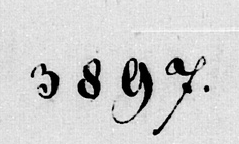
3897.
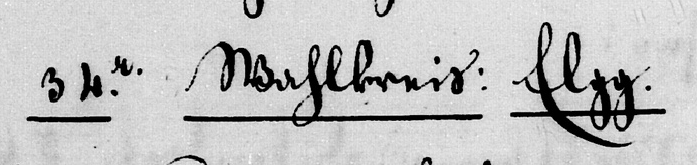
34r. Wahlkreis: Elgg.
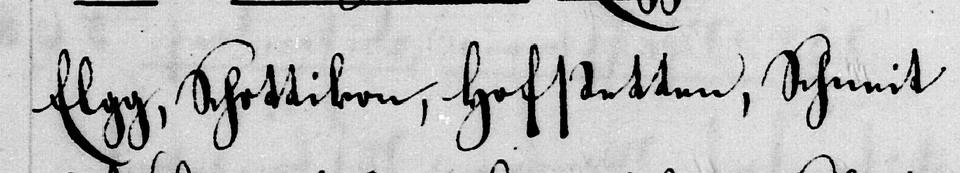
Elgg, Schottikon, Hofstetten, Schneit
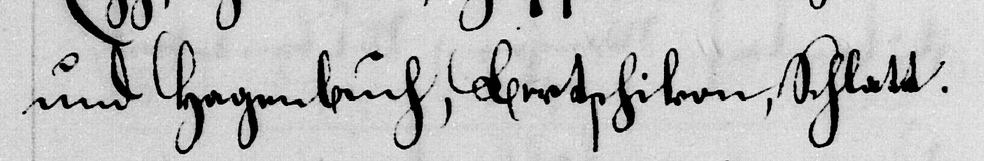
und Hagenbuch, Bertschikon, Schlatt.
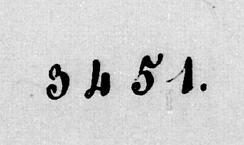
3451.
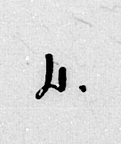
4.
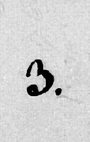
3.
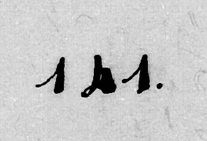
111.
